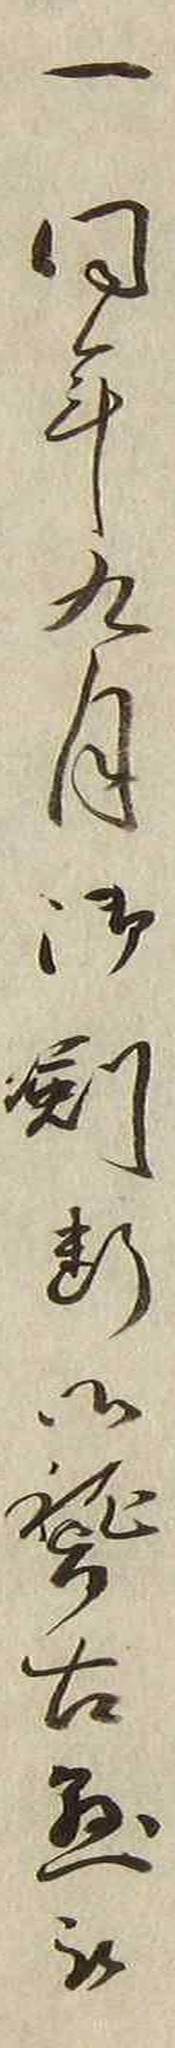一同年九月御剣断御稽古懸被

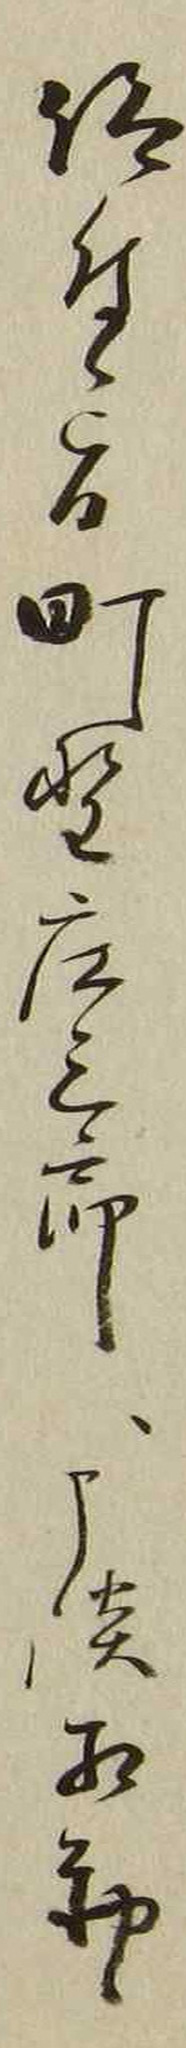仰付候旨町野庄三郎へ申談相勤候
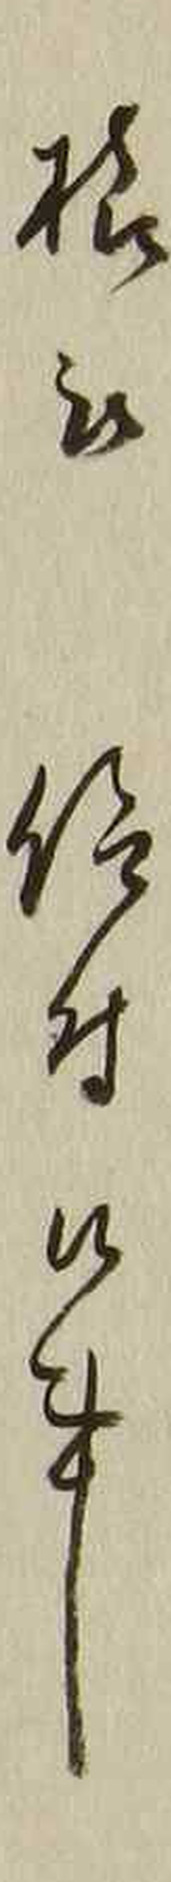様被仰付候事
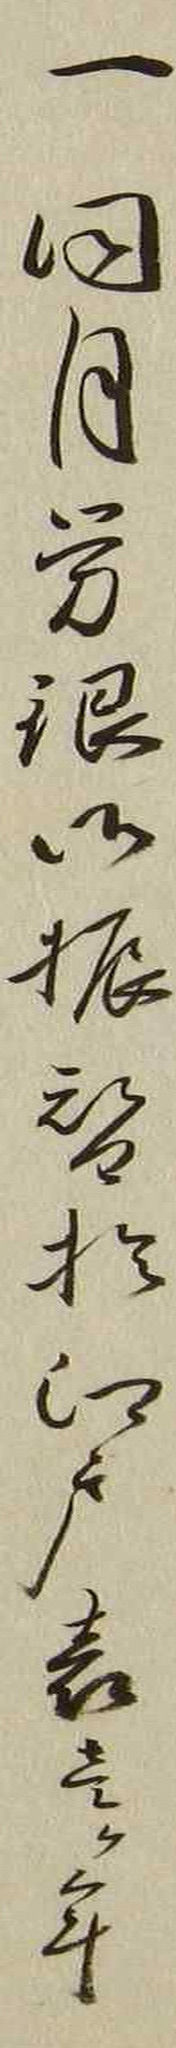一同月労銀御振替於江戸表壱ケ年
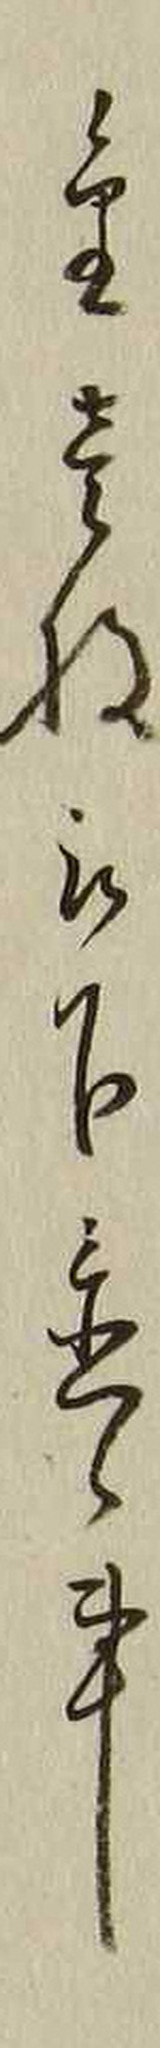金壱枚被下置候事
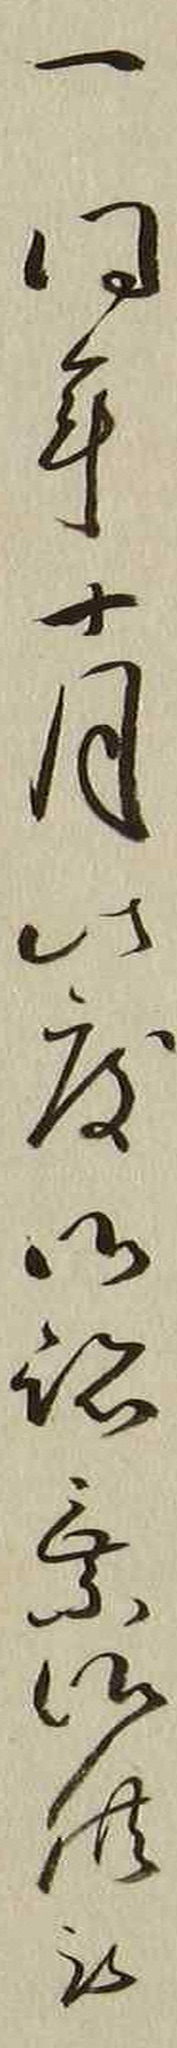一同年十月此度御跡乗御供被
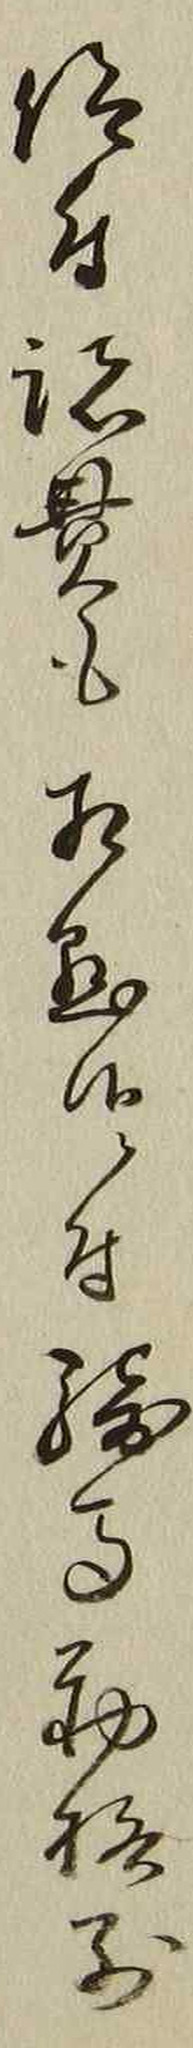仰付諸費も相懸候ニ付騎馬勤格別
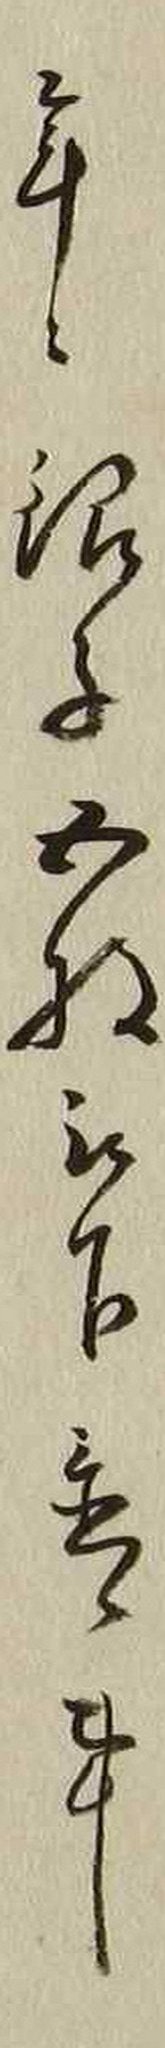年々銀子五枚被下置候事
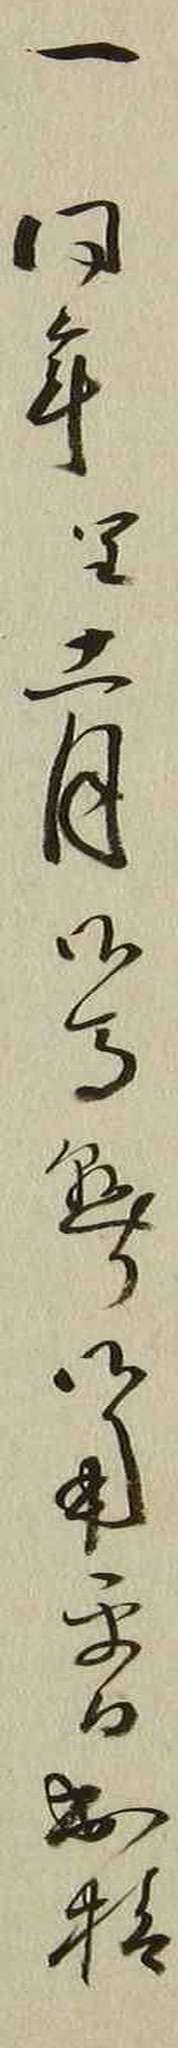一同年閏十一月御馬懸り御用平日出精
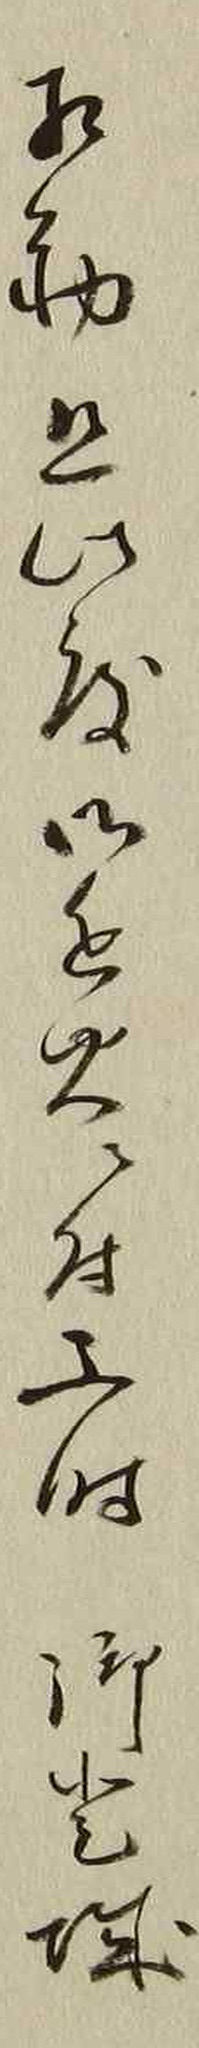相勤旦此度御近火ニ付不時御登城
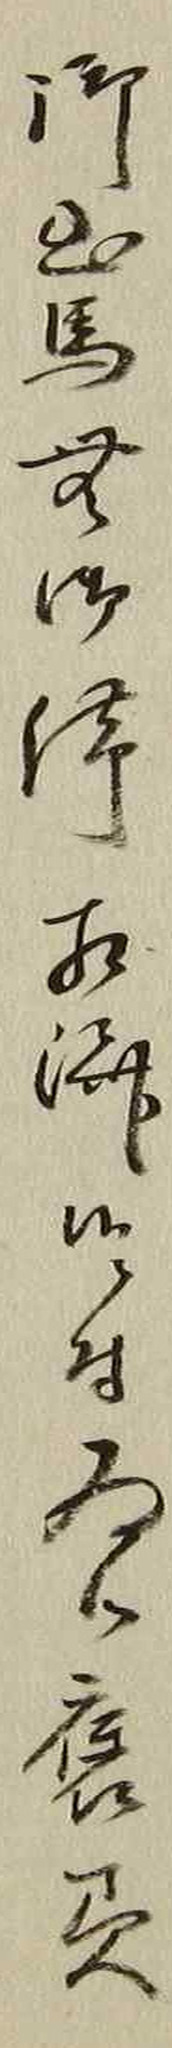御出馬無御滞相済候ニ付為御褒美
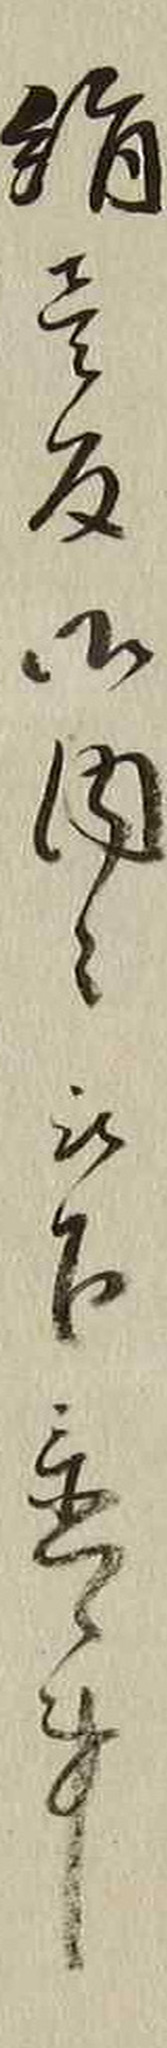絹壱反御内々被下置候事
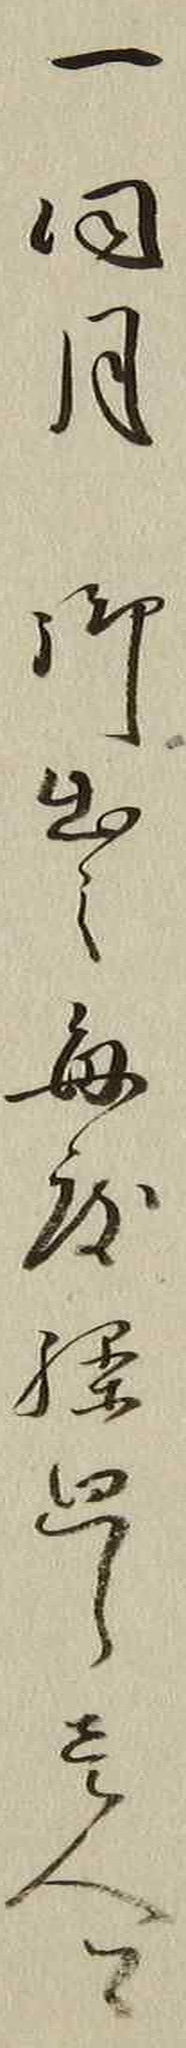一同月御出々毎度繰廻し壱人ツヽ
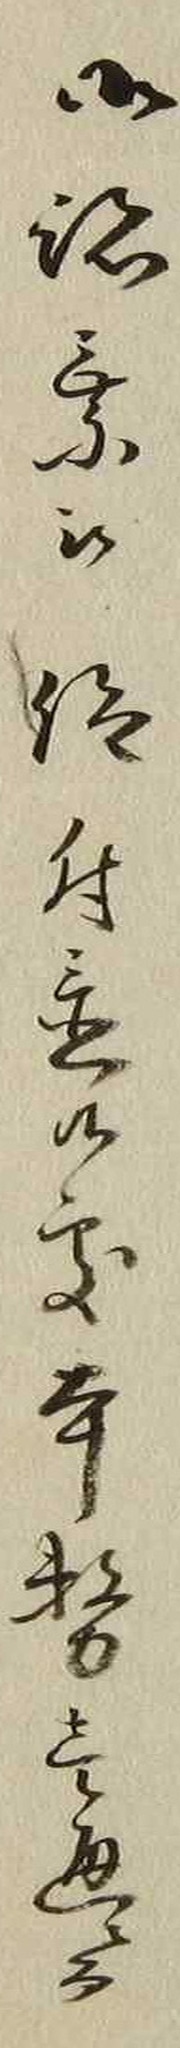御跡乗被仰付置候処本務壱通ニ而
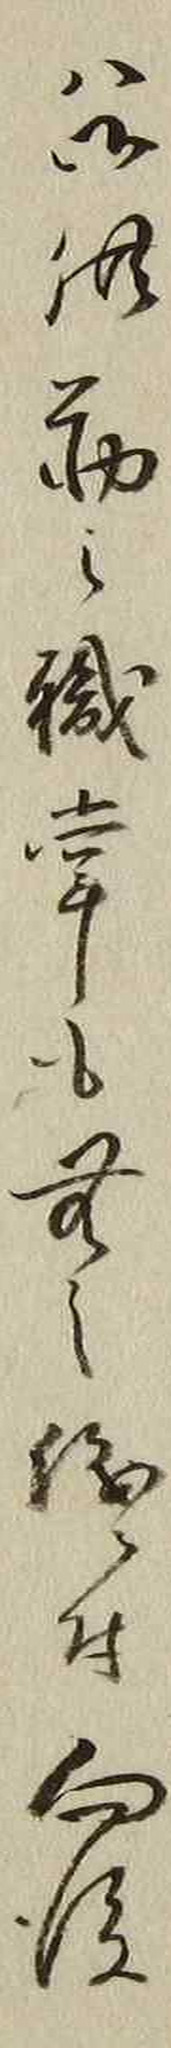ハ御供勤之職常も無之儀ニ付向後
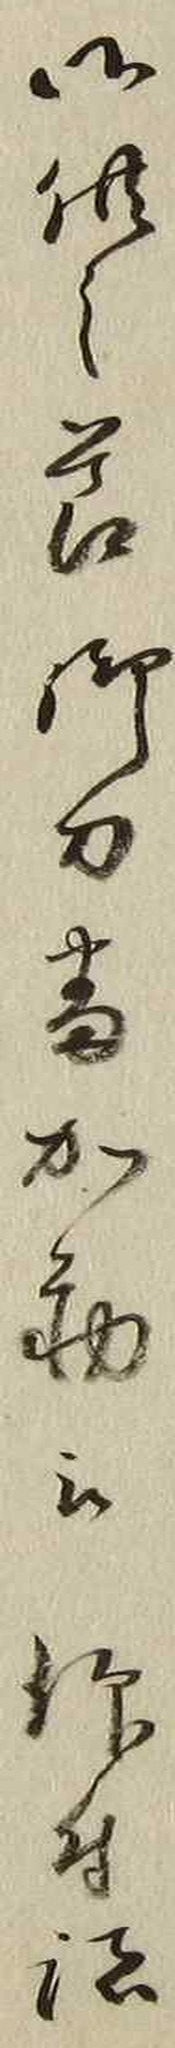御供之節御刀番加勤被仰付諸
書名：諸士系譜　巻之25　い之部25
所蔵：会津若松市立会津図書館
